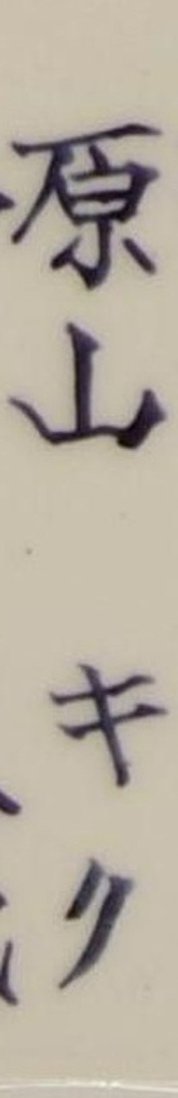原山キク

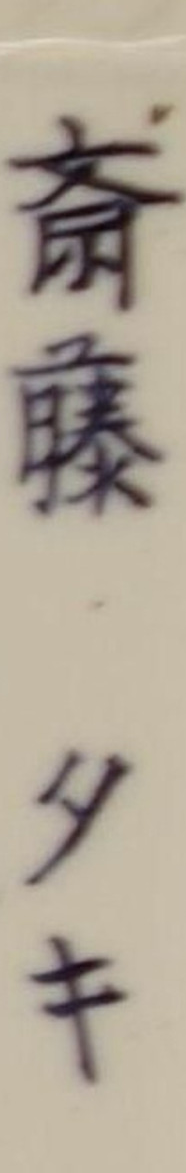斎藤夕キ
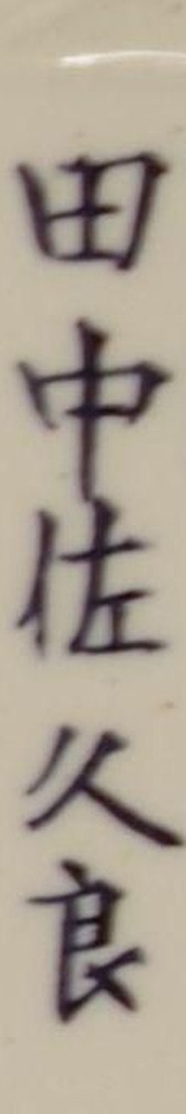田中佐久良
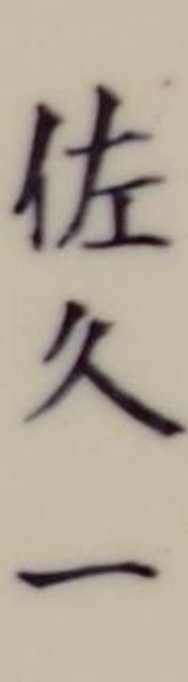佐久一
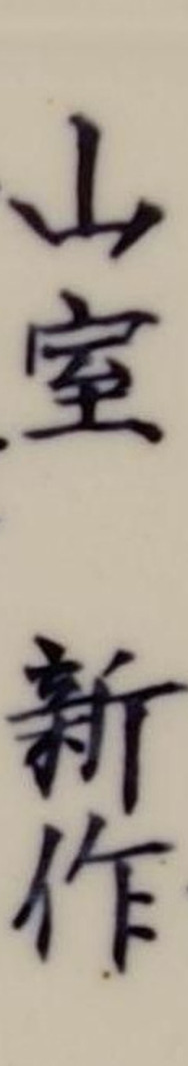山室新作
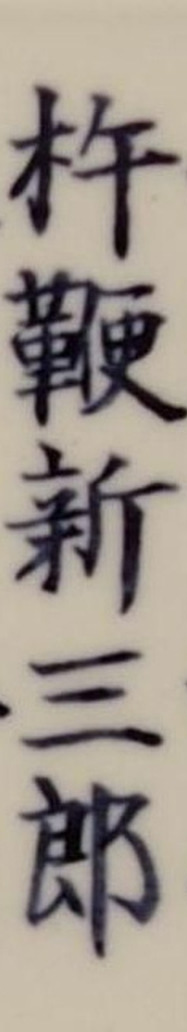杵鞭新三郎
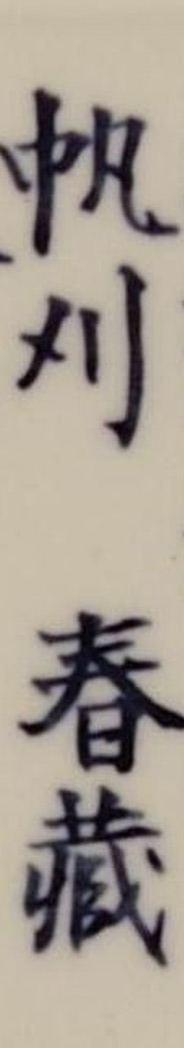帆刈春蔵
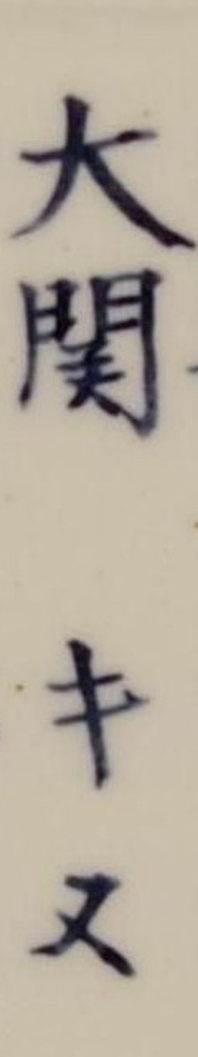大関キヌ
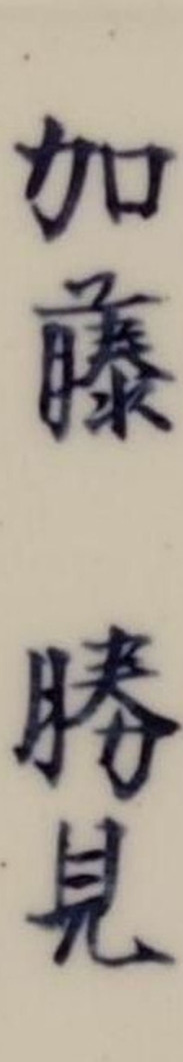加藤勝見
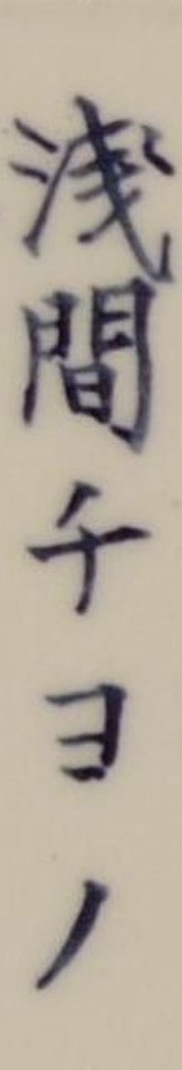浅間チヨノ
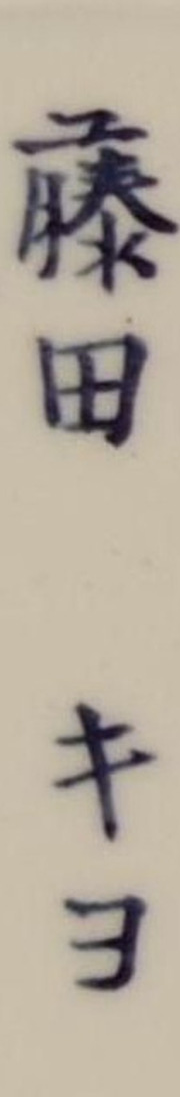藤田キヨ
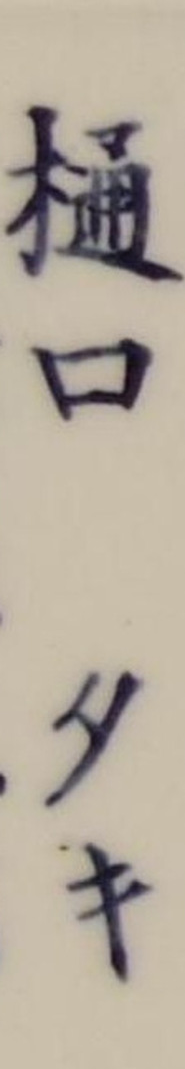樋口タキ
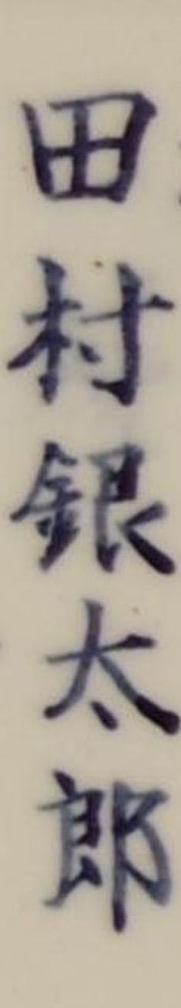田村銀太郎
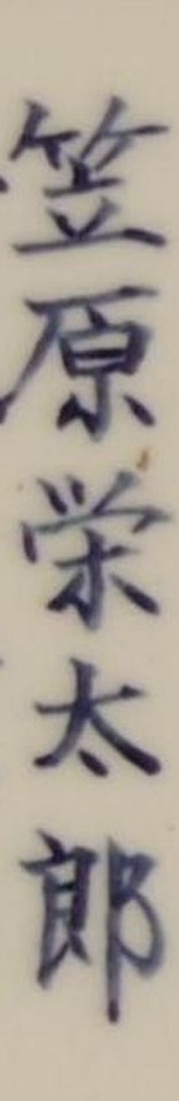笠原栄太郎
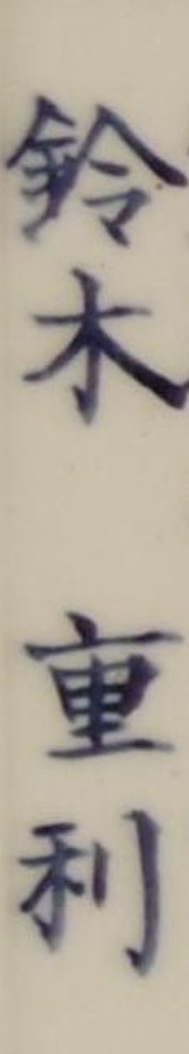鈴木重利

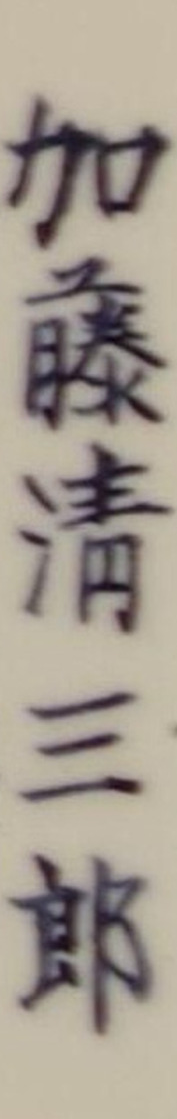加藤清三郎
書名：M~S
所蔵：高野山金剛峯寺
